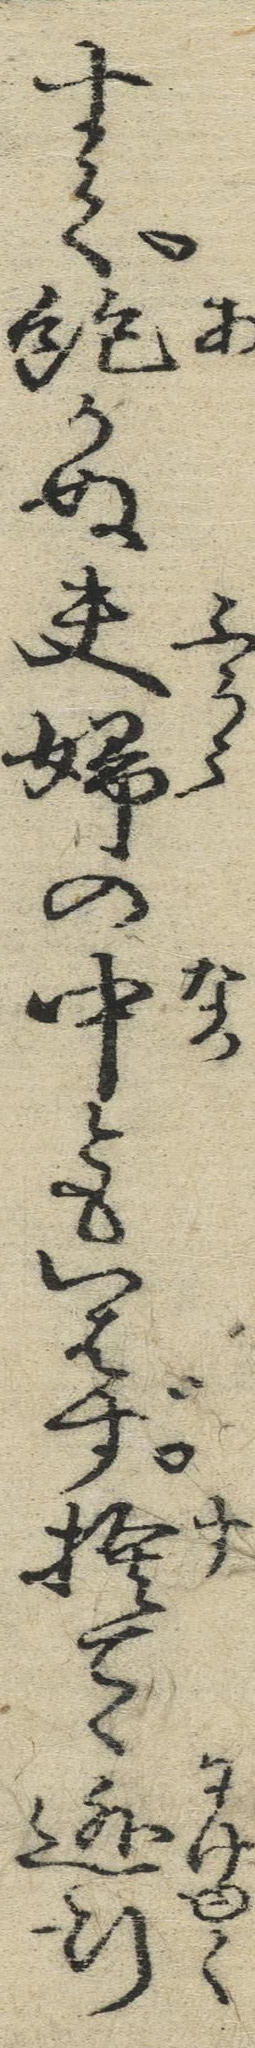すて。飽かぬ夫婦の中ともいはず。捨てて逃行
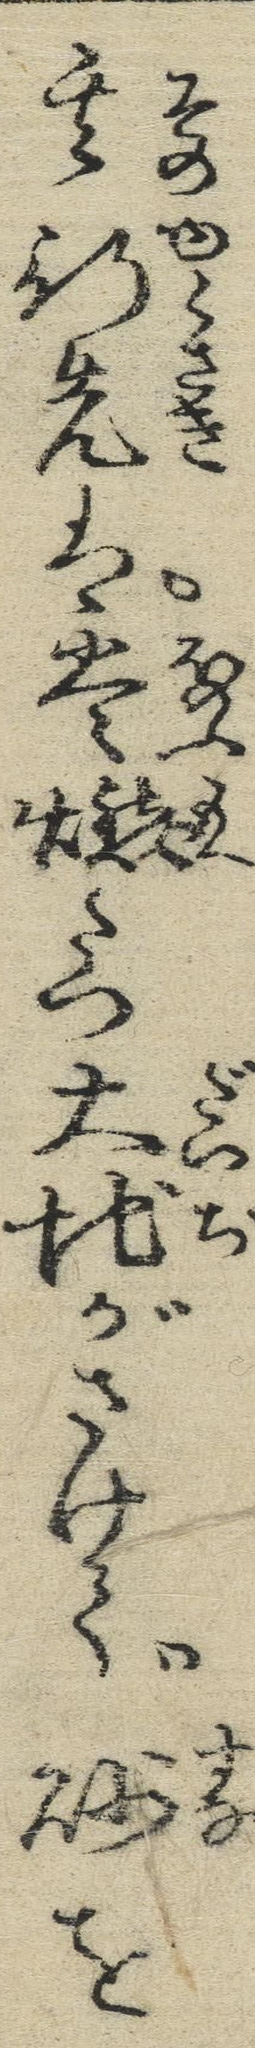其行先は。炎燃たつ大地がさけて。砂を
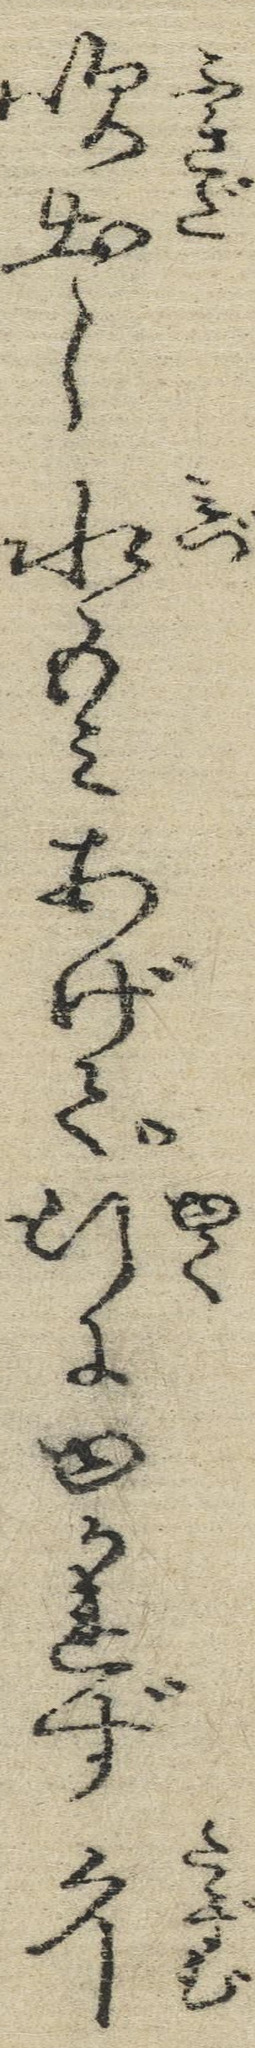吹出し水もみあげて。行にゆかれず彳
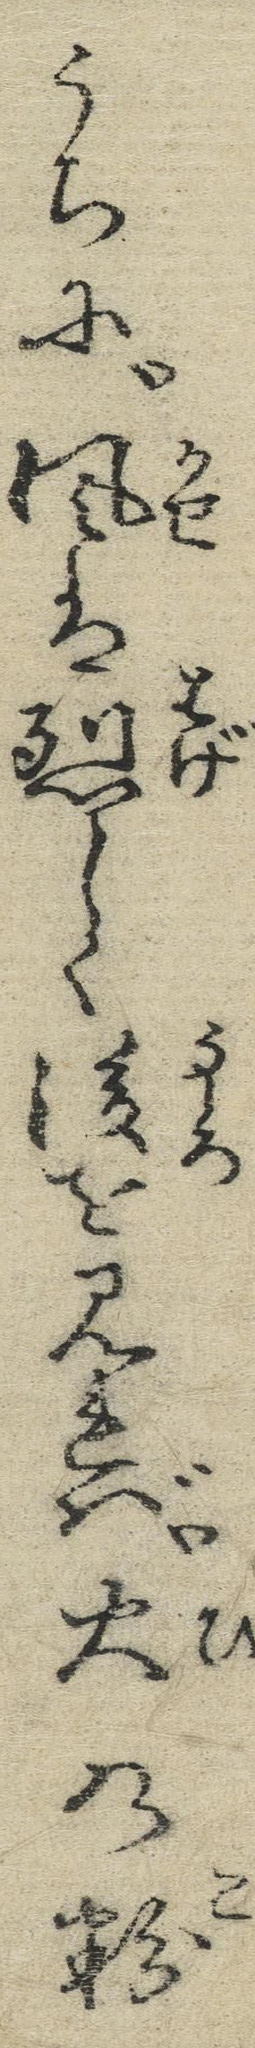うちに。風は烈しく後を見れば。火の粉
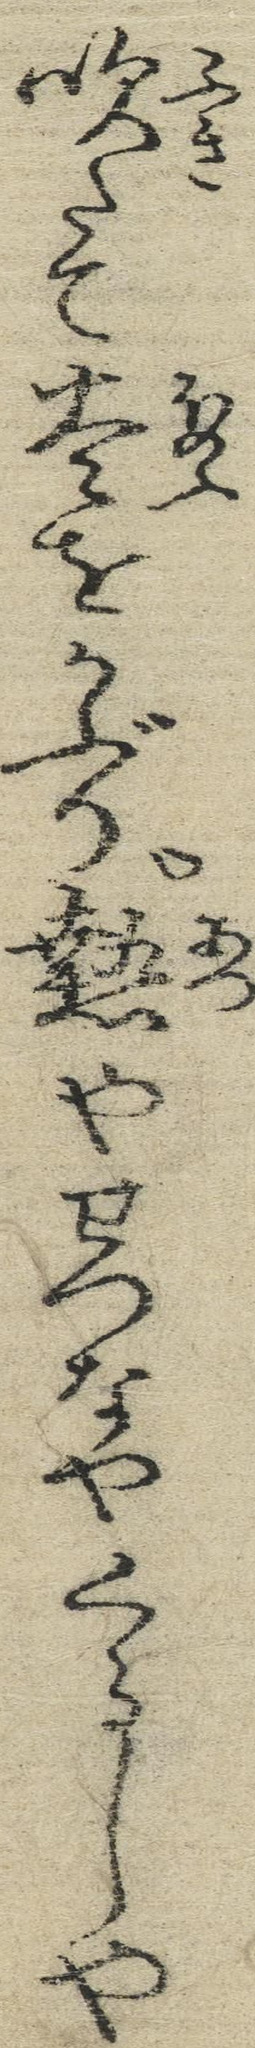吹たて炎をかぶり。熱やせつなやくるしや
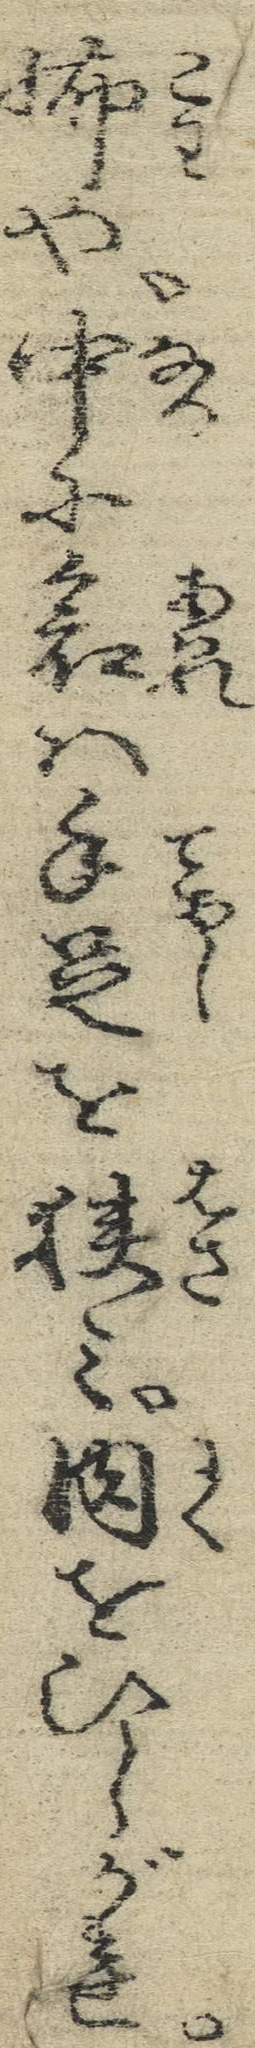怖や。中に哀は手足を挟み。肉をひしがれ

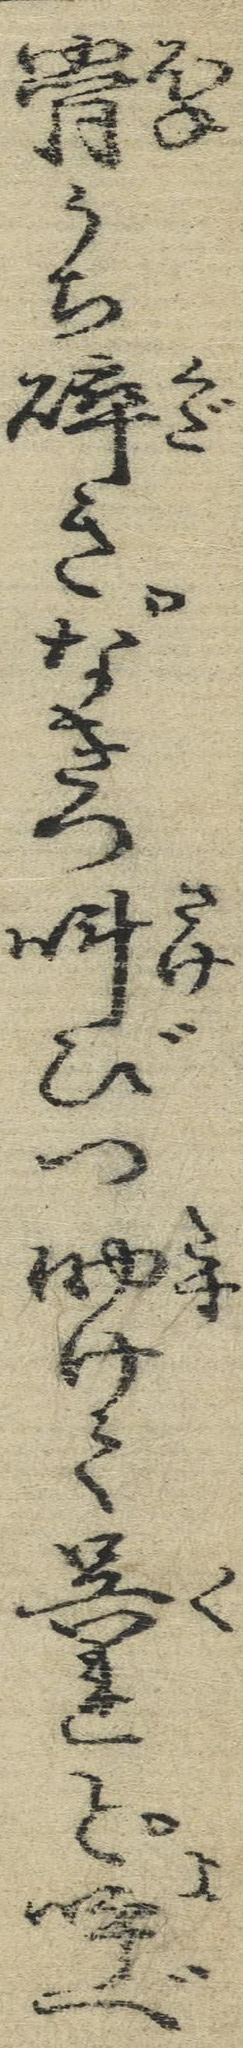骨うち砕き。なきつ叫びつ助けて呉れと。呼べ
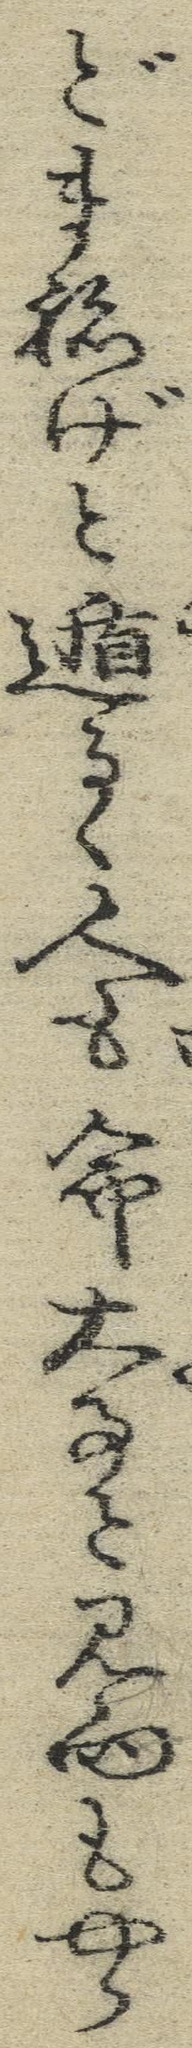どまねげと遁るゝ人も。命大事と見向もやら
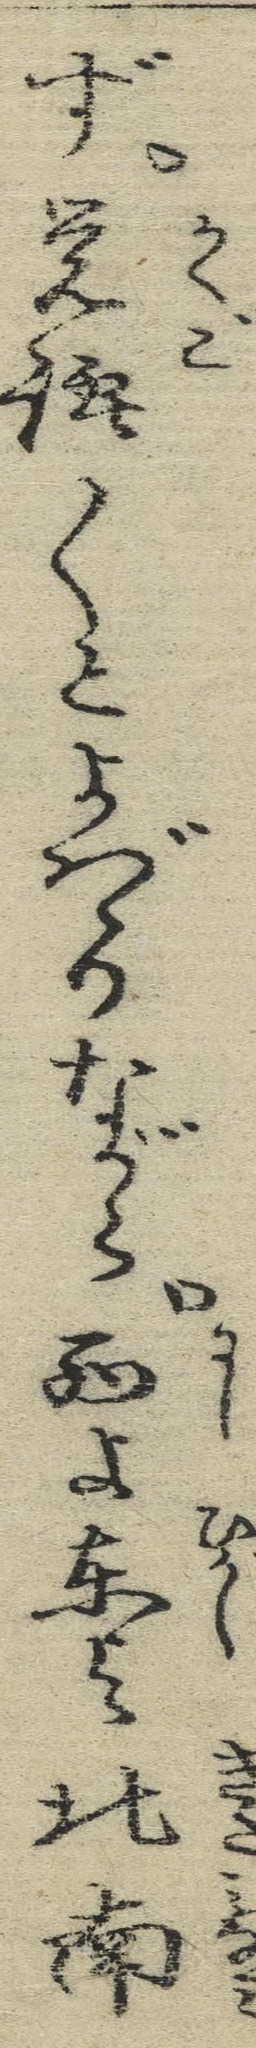ず。覚悟〳〵とよばゝりながら。西よ東よ北南
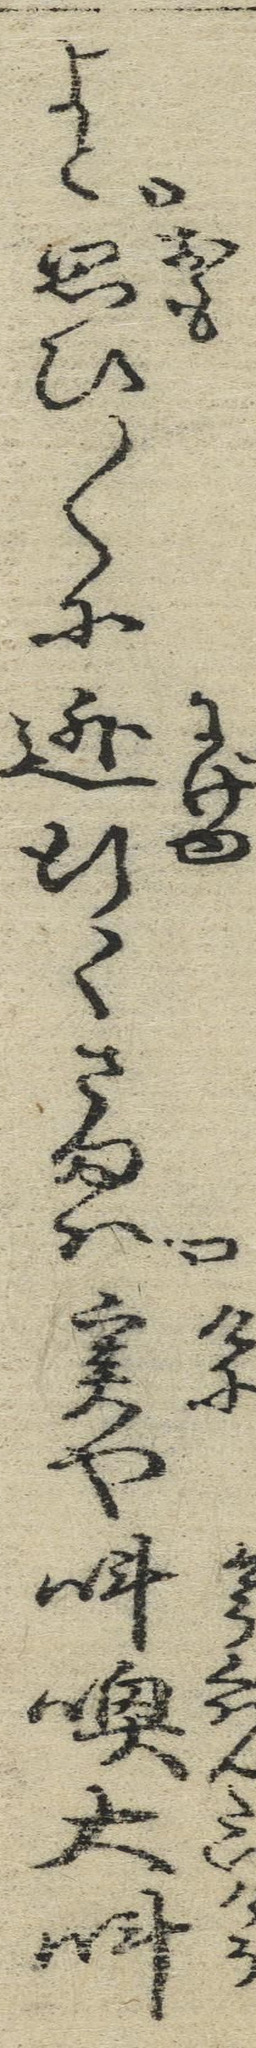よと。思ひ〳〵に逃行くさまは。実や叫喚大叫
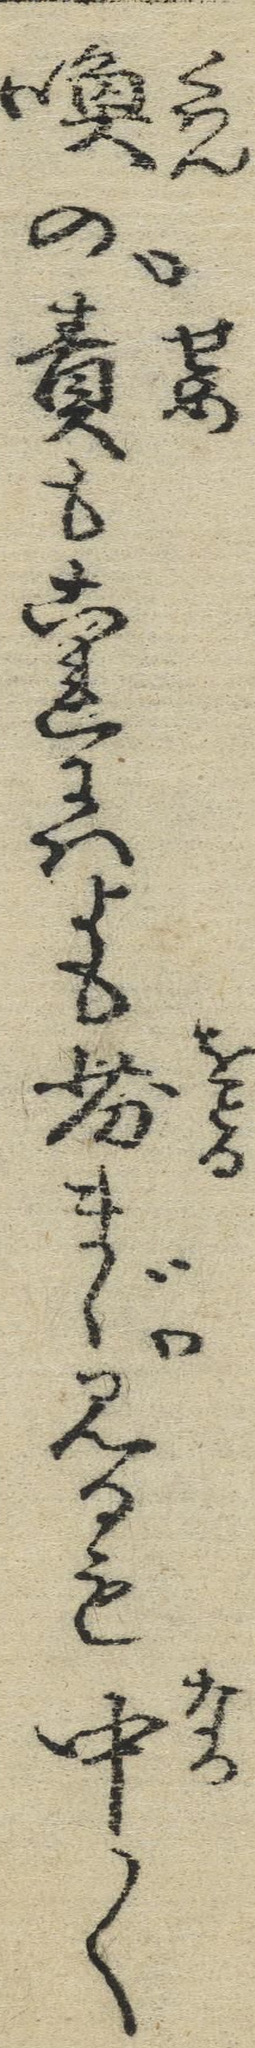喚の。責もこれにはよも劣まじ。見るも中〳〵
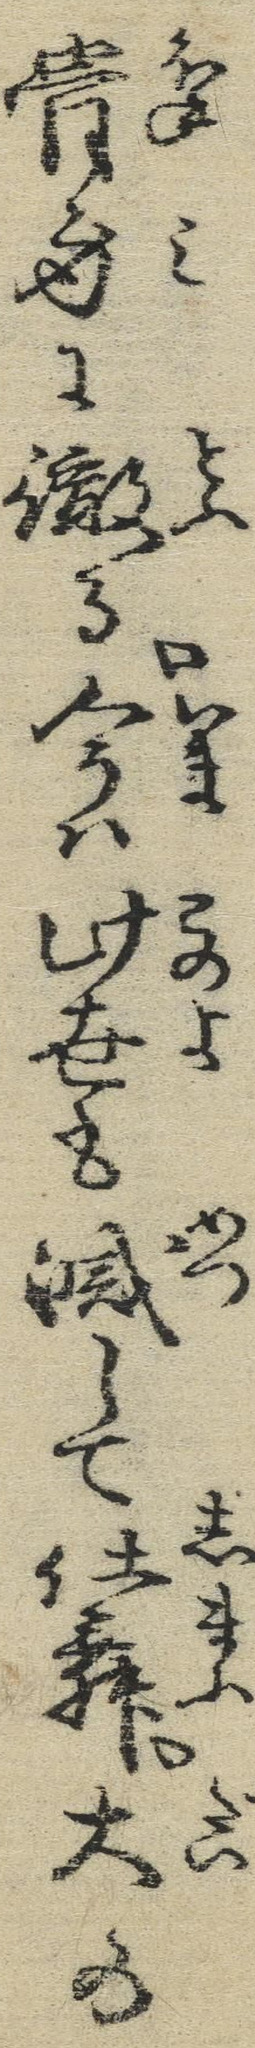骨身に徹る。今は此世も滅して仕舞。大の
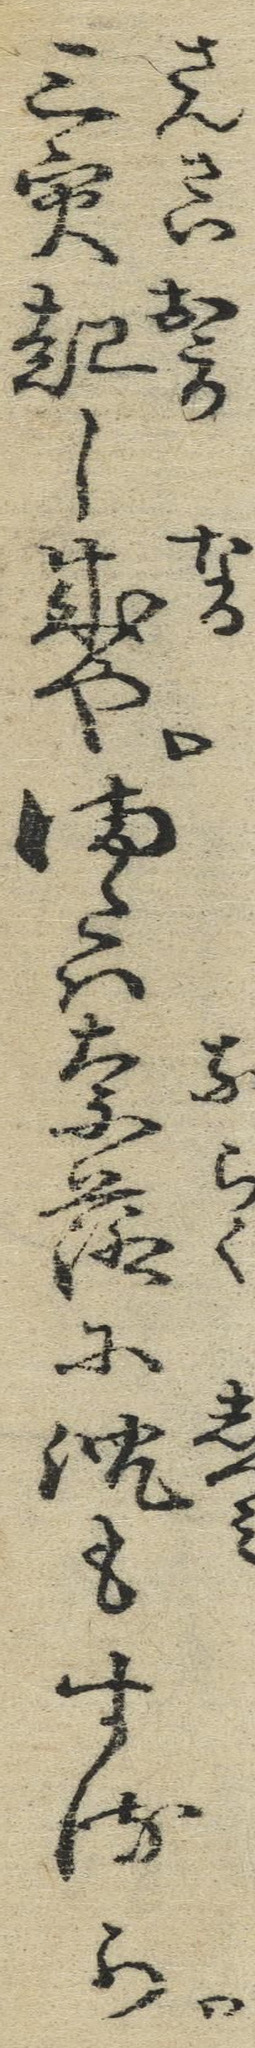三災起し成や。または奈落に沈もするか。
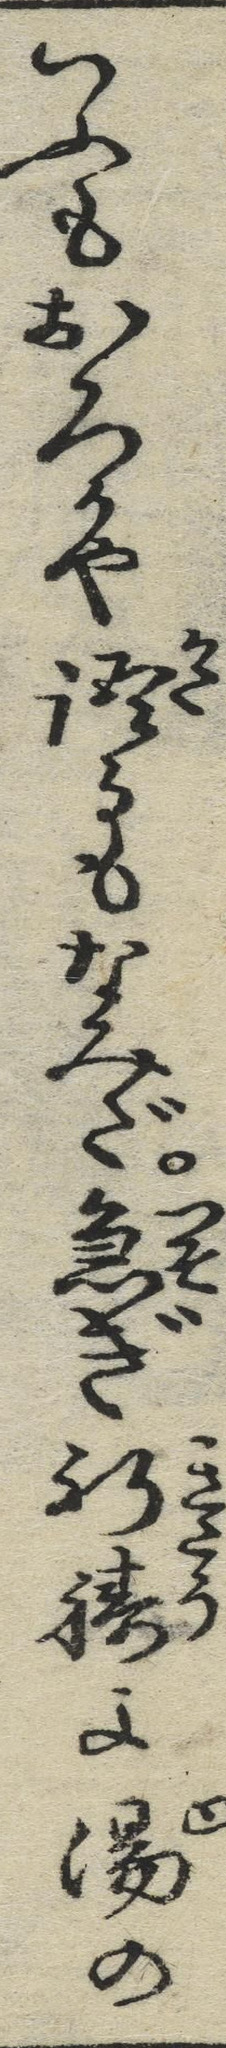いふもおろかや語もなみだ。急ぎ祈祷に湯の
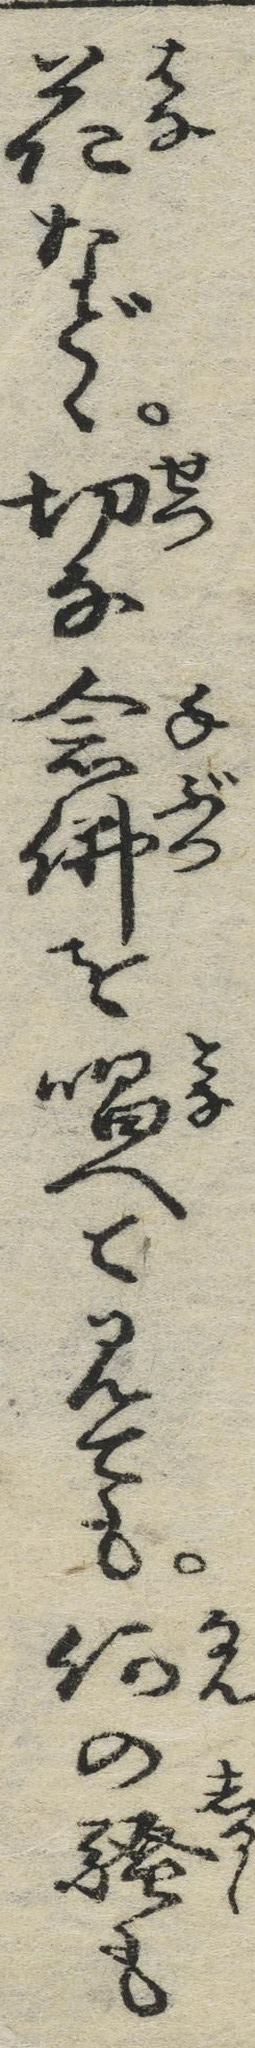花などゝ。切な念仏を唱へて見ても。何の験も
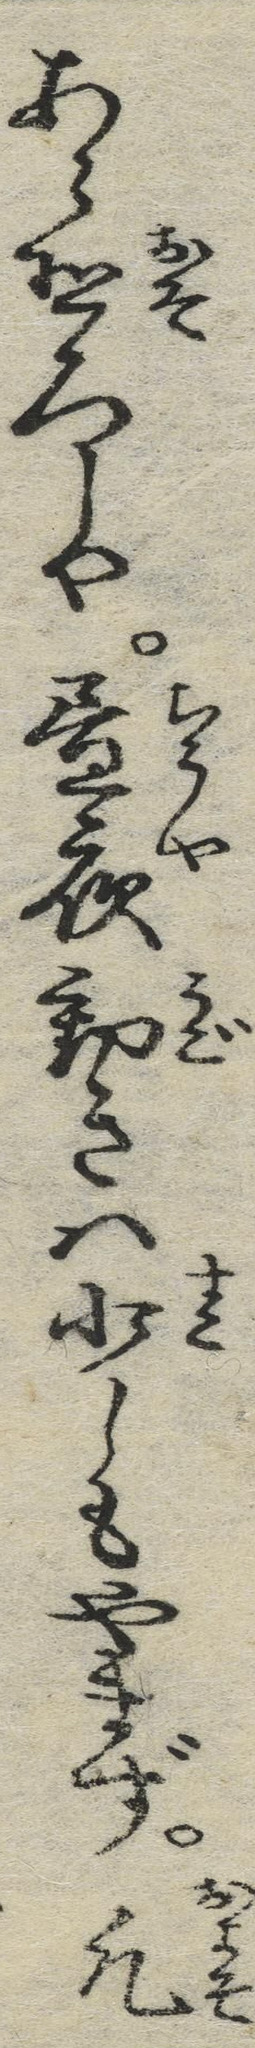あら恐ろしや。昼夜動きは少しもやまず。凡
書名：越後地震口説
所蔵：東京大学地震研究所図書室 Earthquake Research Institute Library, The University of Tokyo, JAPAN
